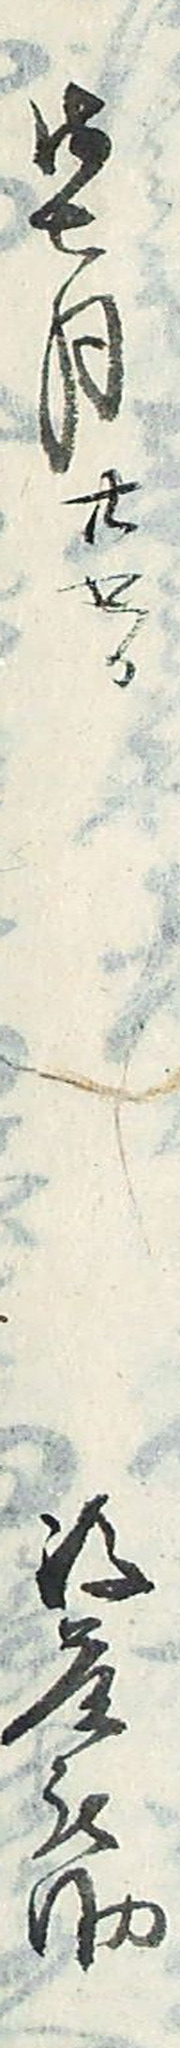戌七月廿四日後藤善助
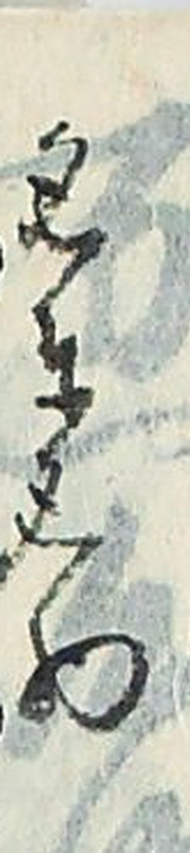名東名西
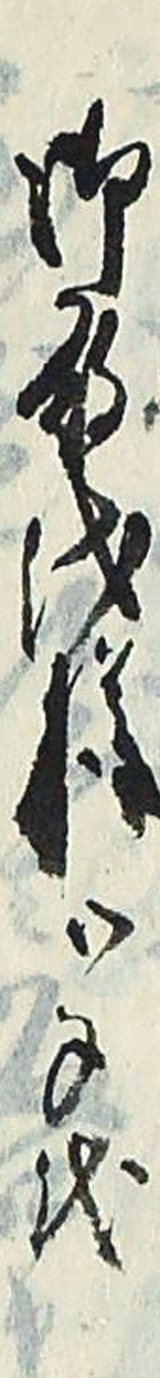御郡代様御手代
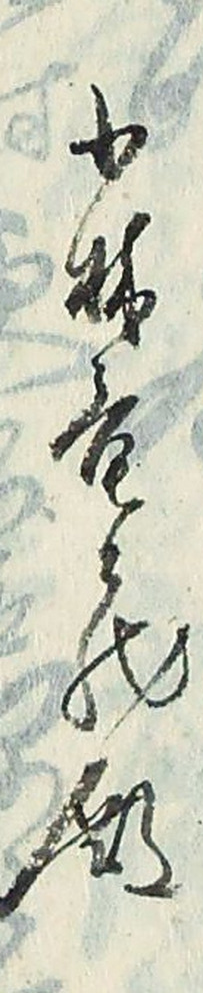小林竜蔵殿
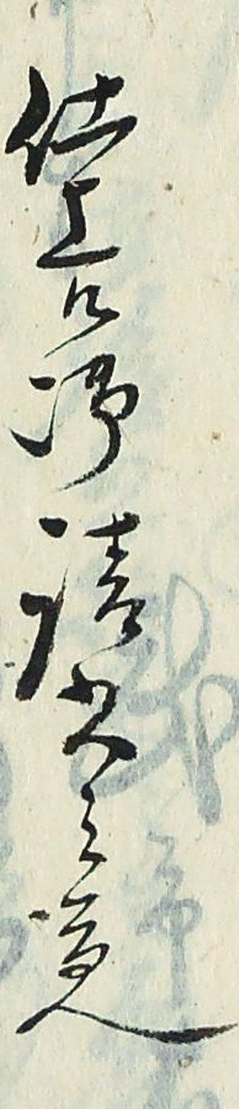仕上候御請書之覚
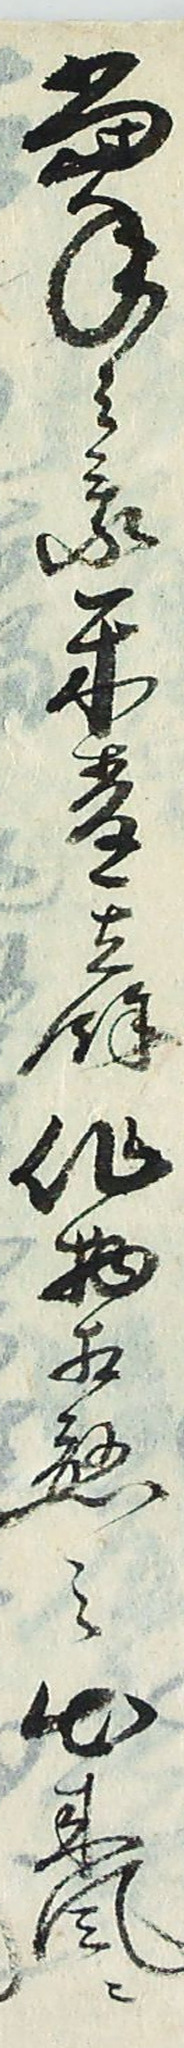当年之義米麦其余作物相応之出来風に
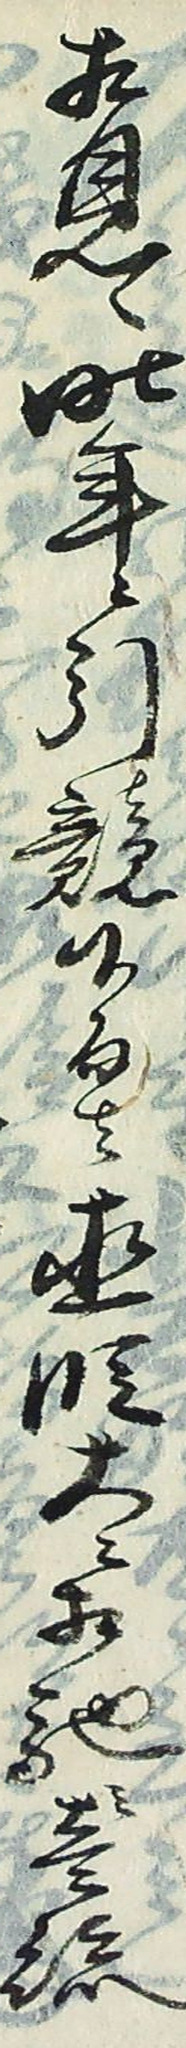相見へ昨年に引競候而は直段大に相弛み壱統
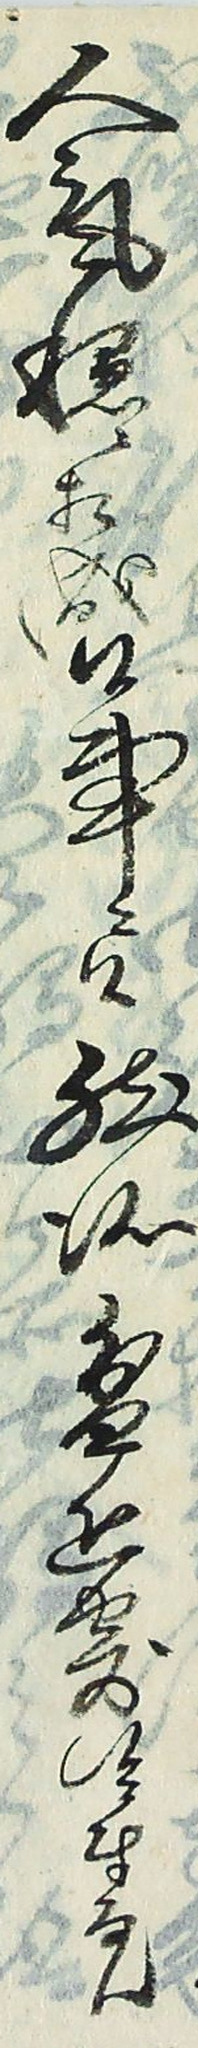人気穏に相成候事に候然所盆近寄候に付而は
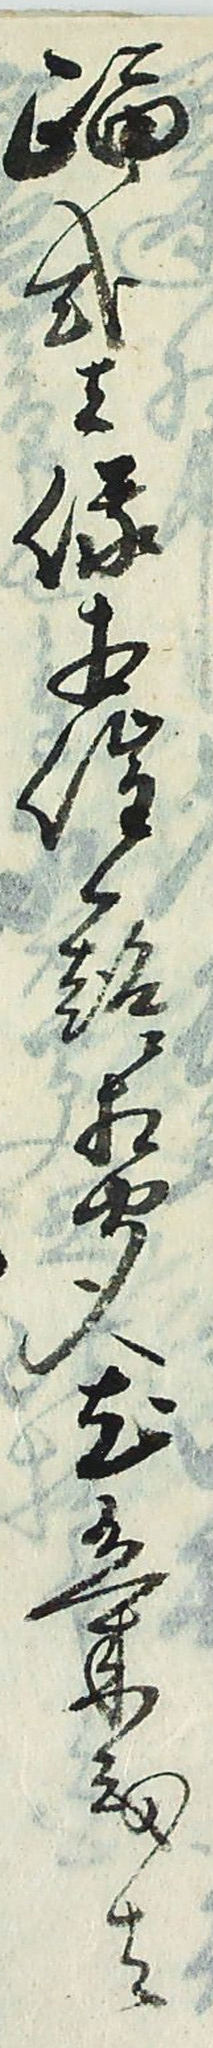踊或は俄相催候趣に相聞へ尤有来義は
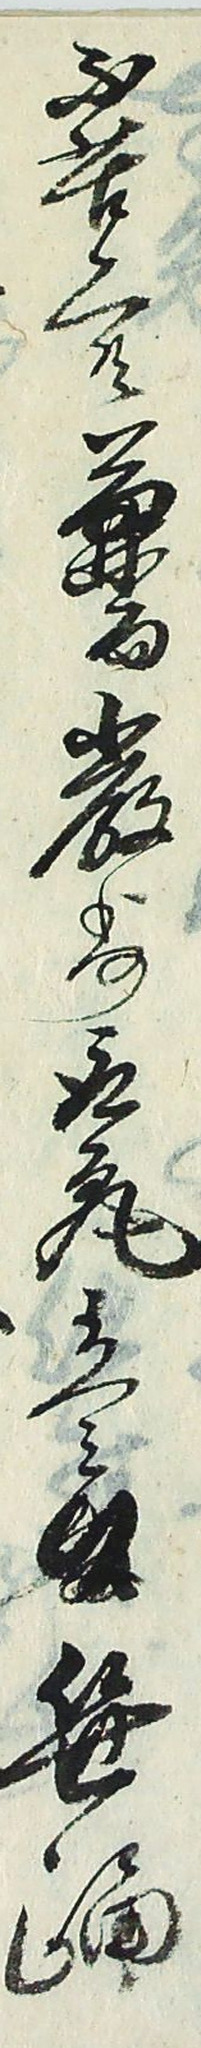不苦候へ共兼而厳布取究有之候笹踊
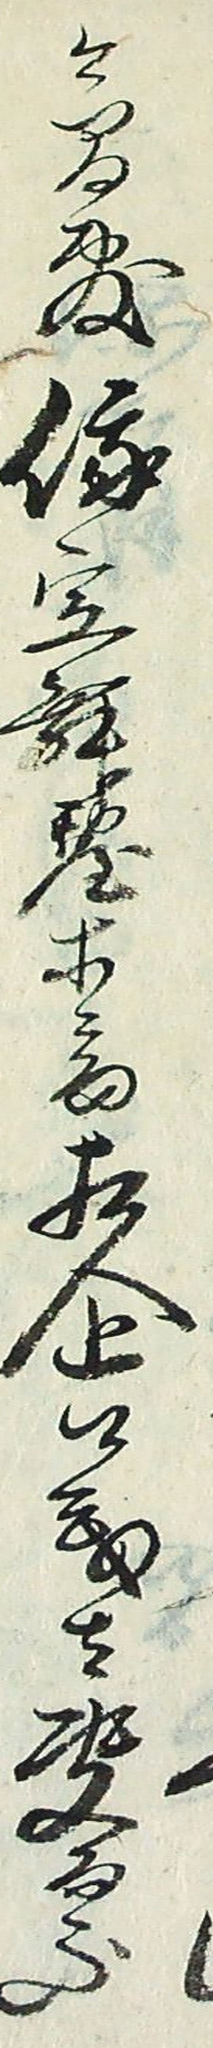ケ間敷俄定舞台等に而相企候義は決而不
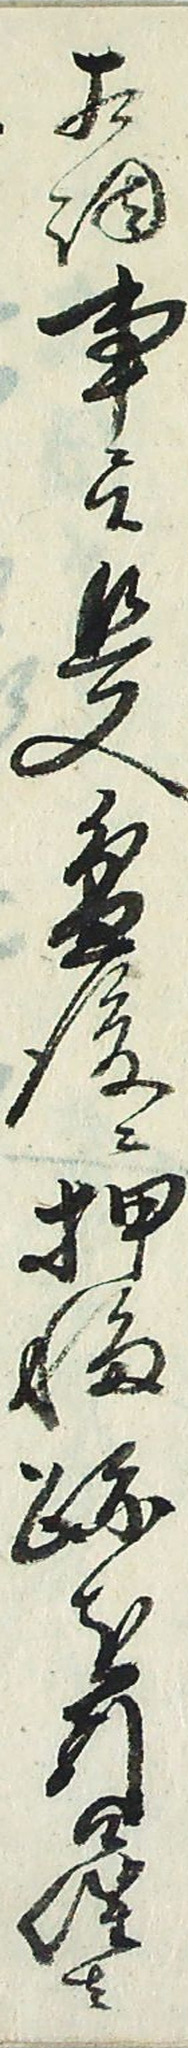相調事に候且又盆後に押移跡を引候催は
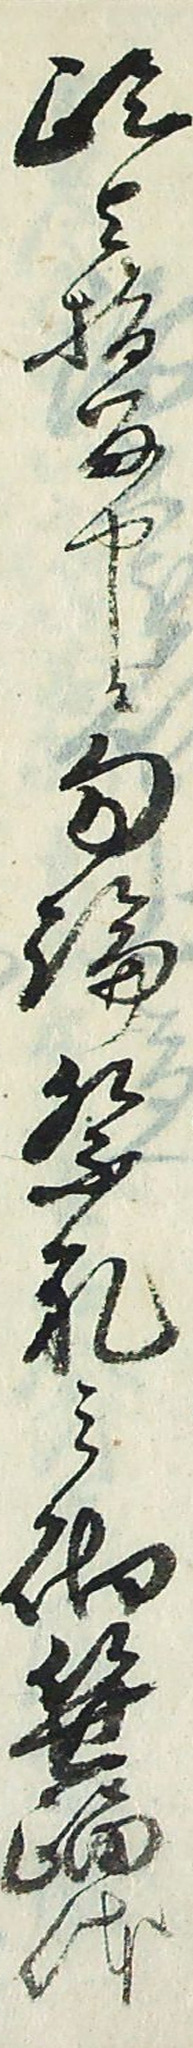屹と指留申候勿論祭礼之砌笹踊体
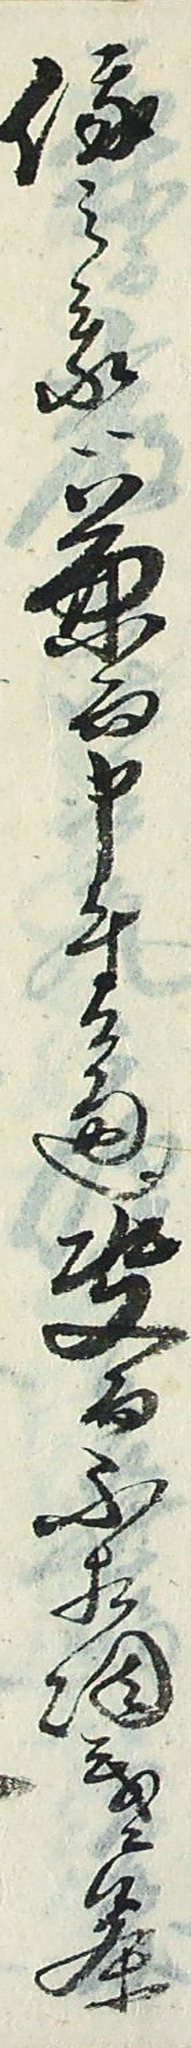俄の義は兼而申付候通決而不相調義に候条
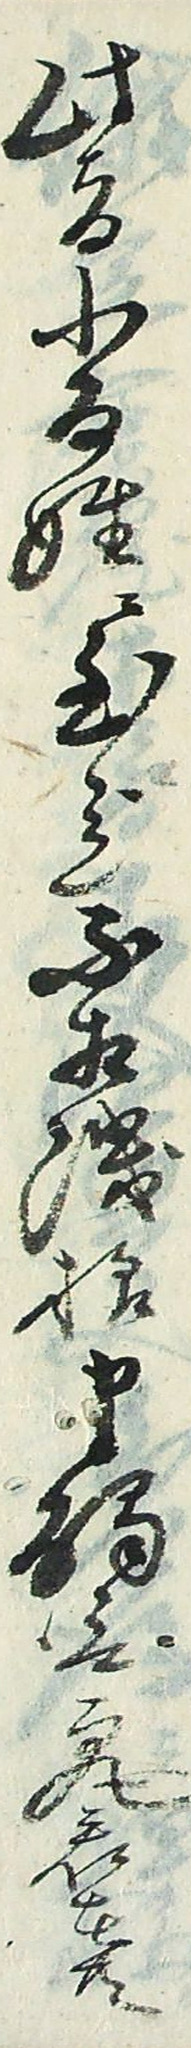此旨小百姓に至迄不洩様申触取究若者共

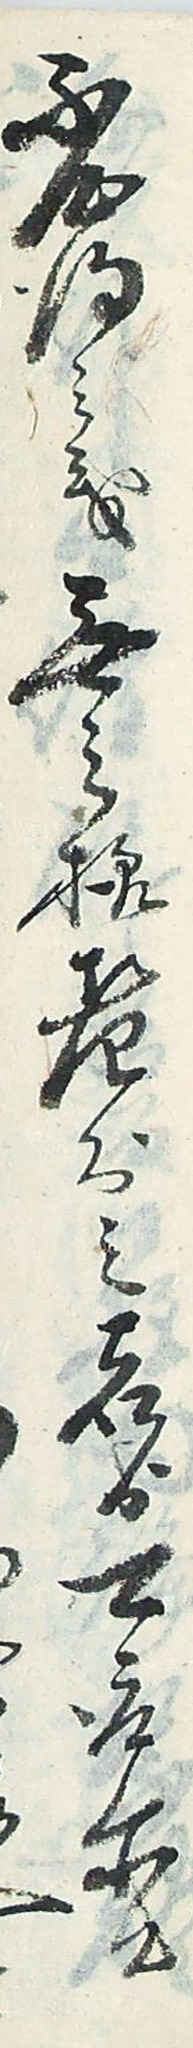不心得之義無之様老分之者ゟ可取示候
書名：諸御用御□受書控
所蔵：鳴門教育大学 Naruto University of Education
